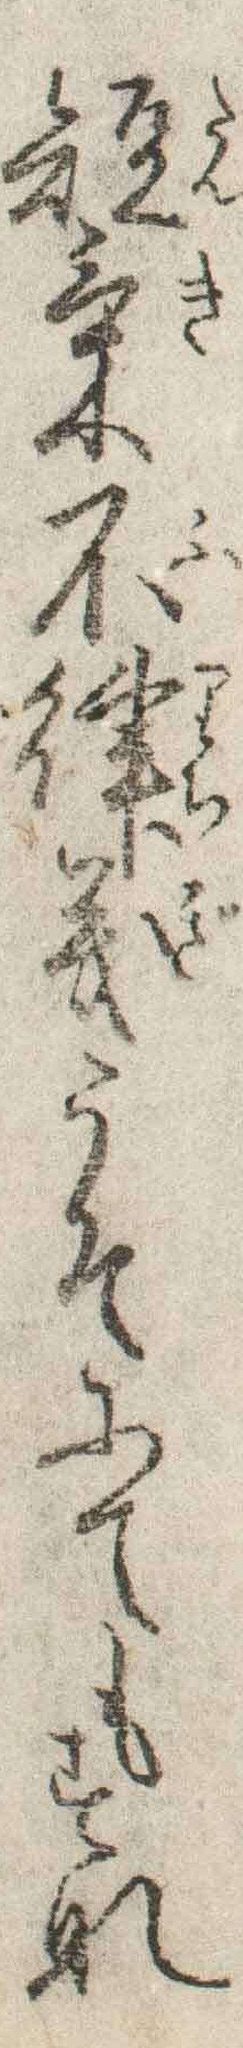短気不律義うそにてもすな
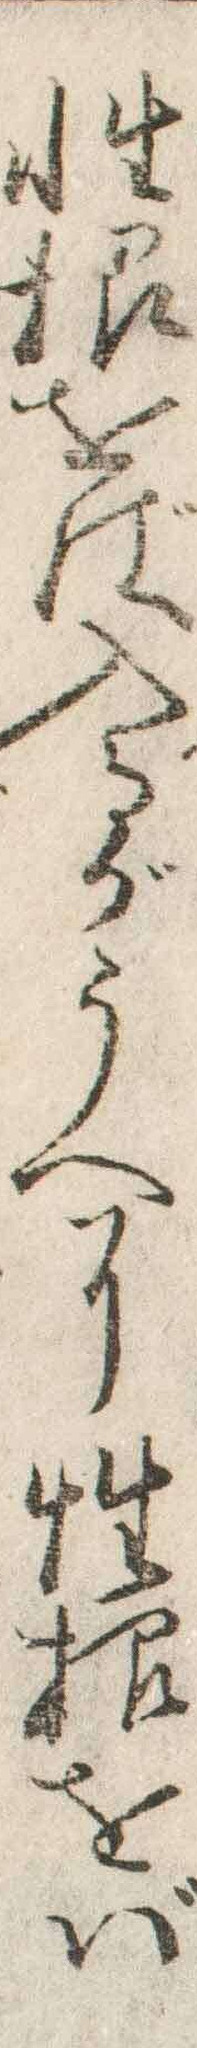性根をば入るがうへに性根をば
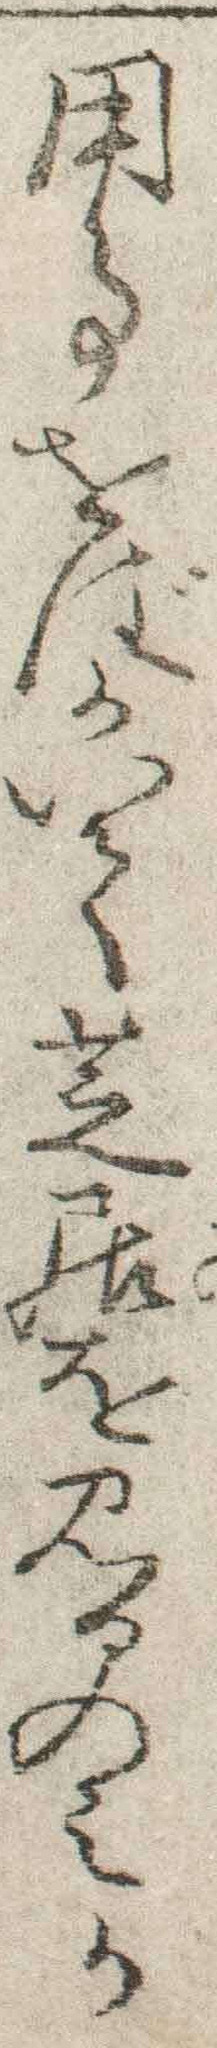用事をばかいて芝居を見るのみか
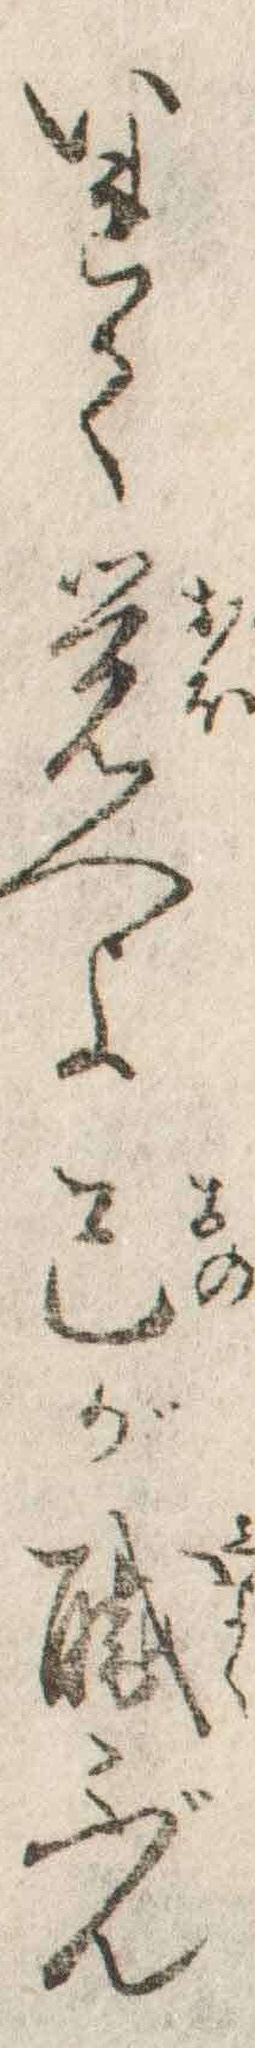いれて覚へよ己が職ぶん
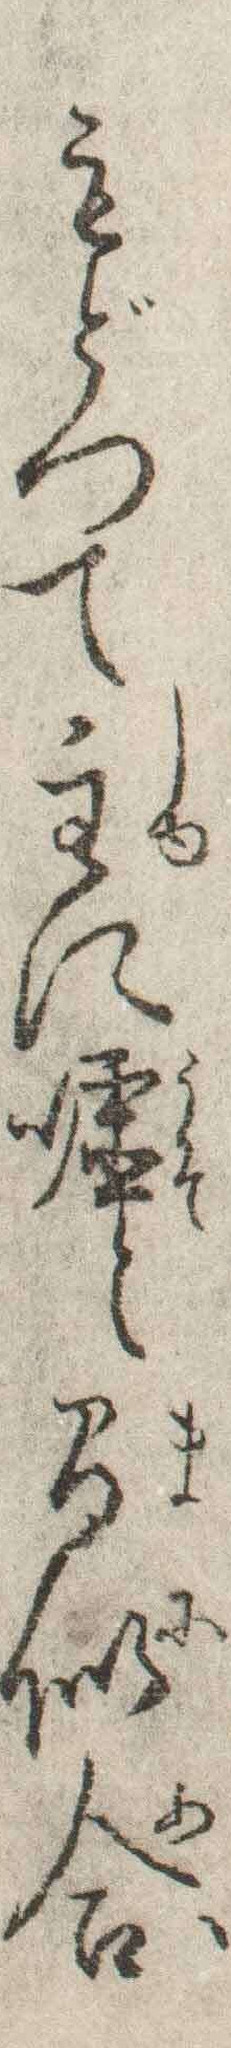もどつて主に嘘と間似合
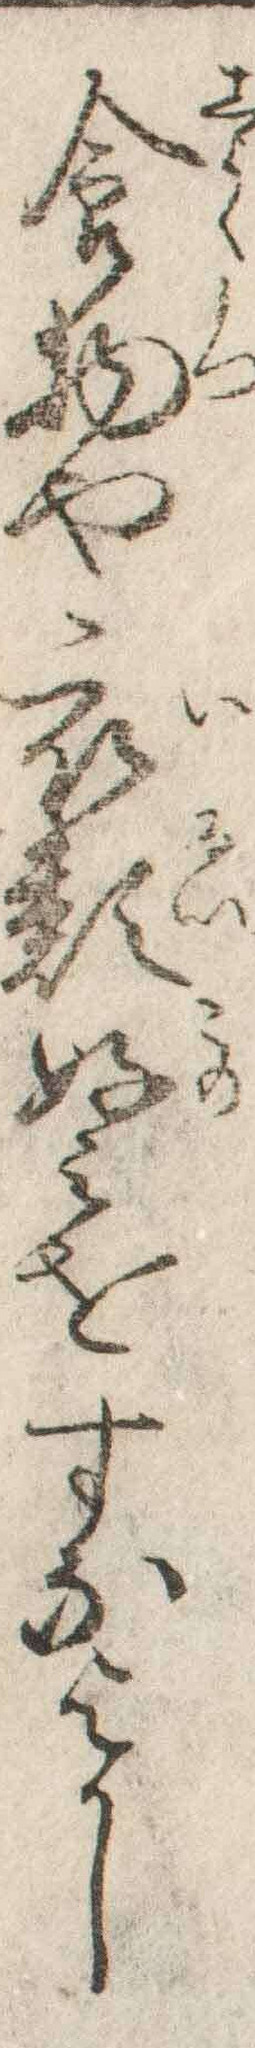食物や衣類好みをすなよかし
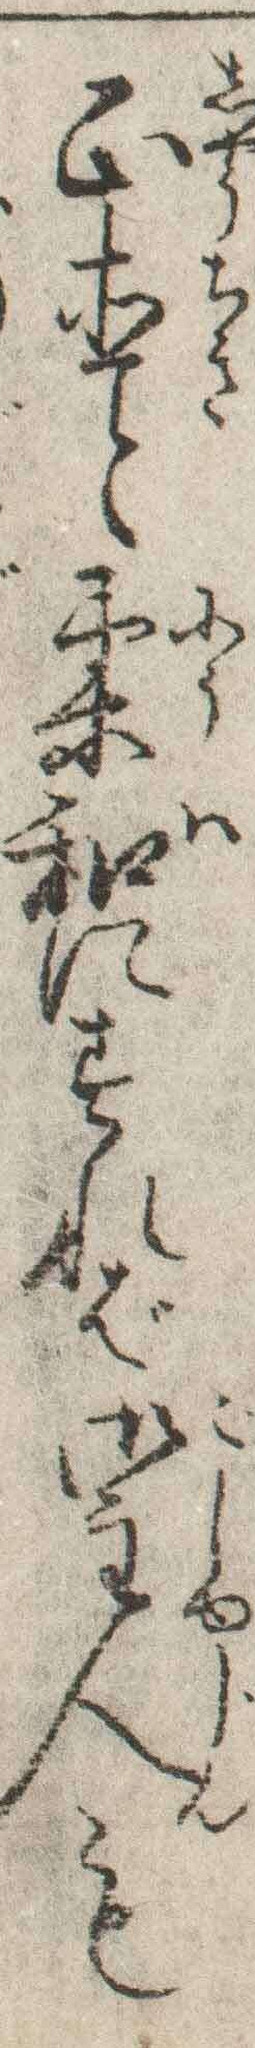正直と柔和にすれば御主人も
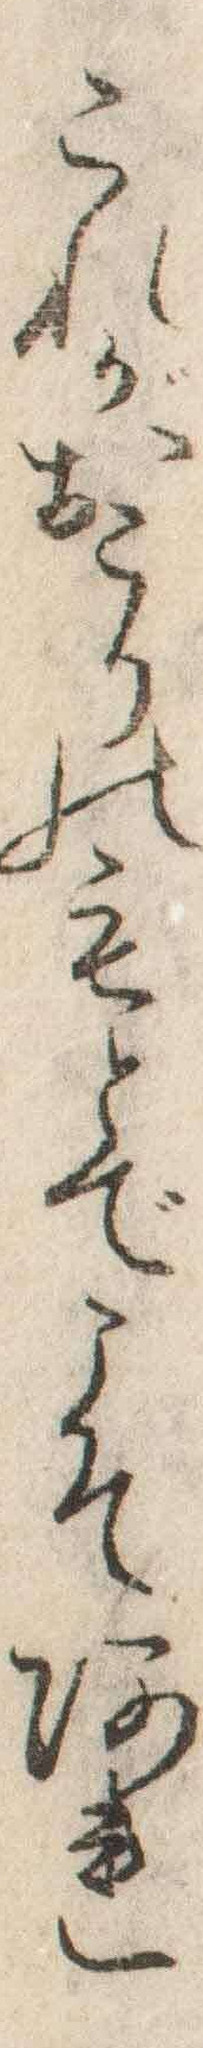これがおこりのもとでこそあれ
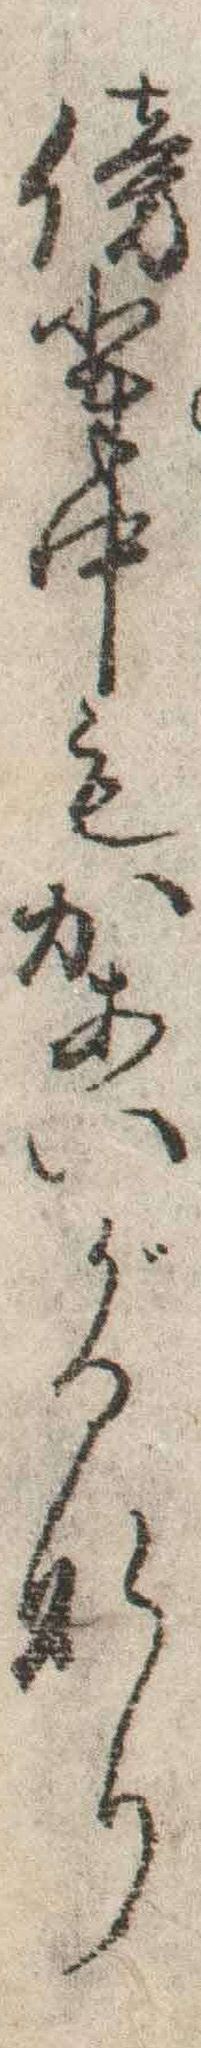傍輩中もかあいがるなり

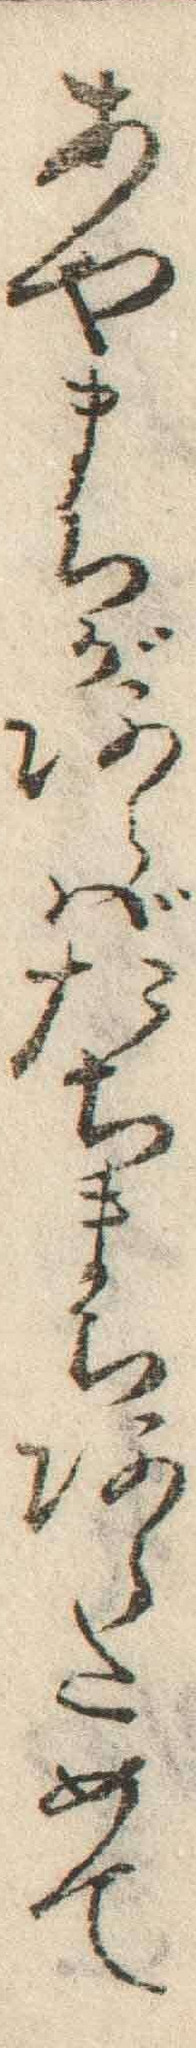あやまちがあらばたちまちあらためて
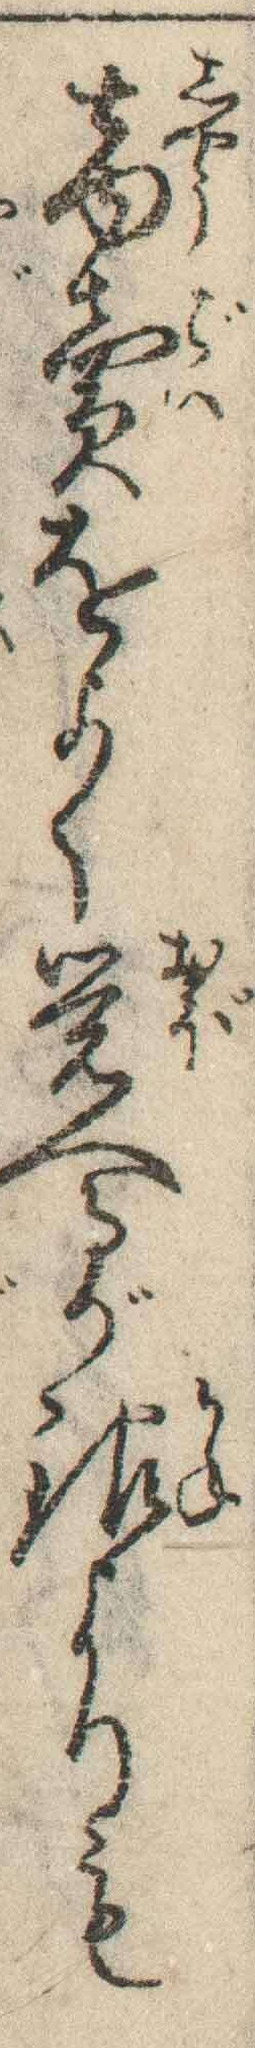商売をよく覚へるが銀よりも
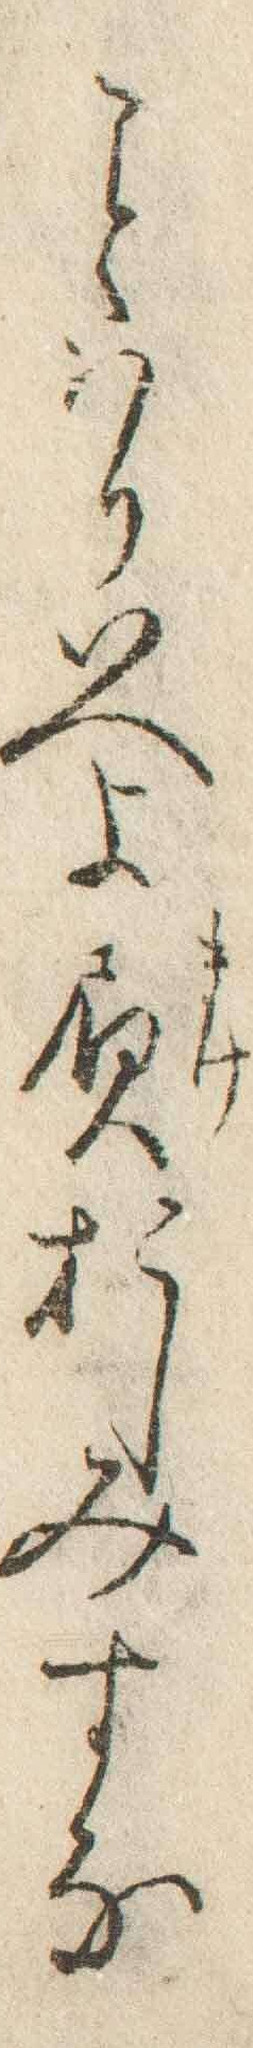ことはりいへよ負おしみすな
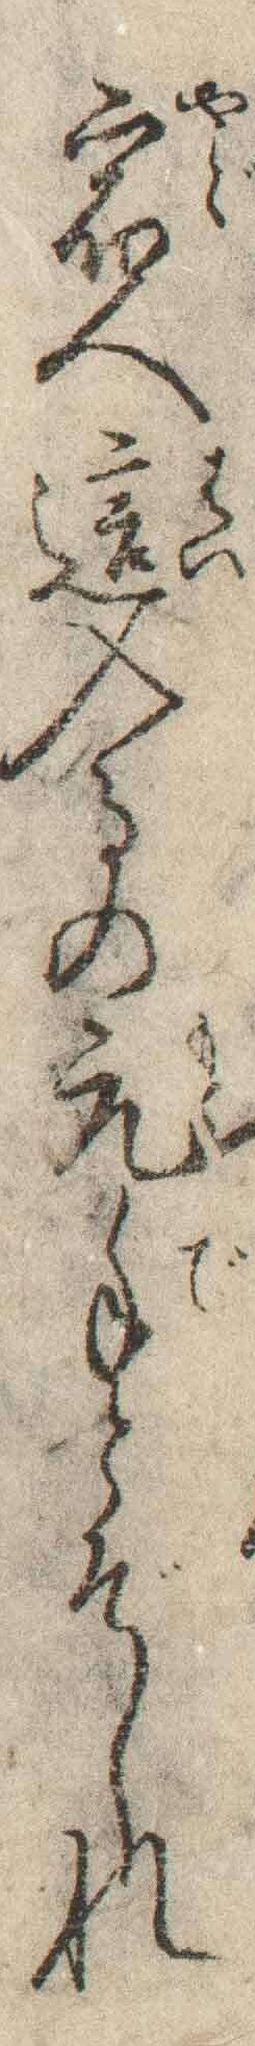宿へ這入るの元手とぞしれ
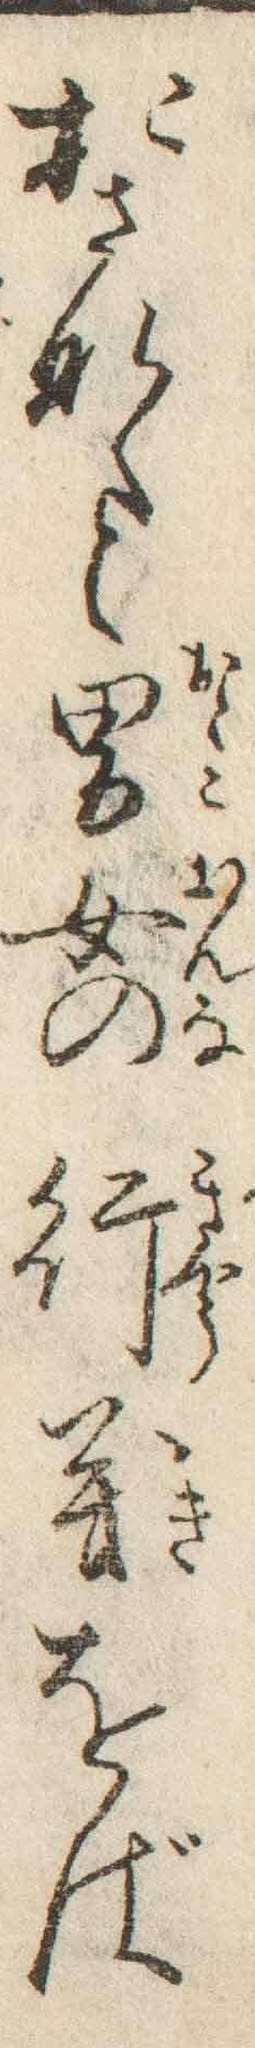おさなくと男女の行義をば
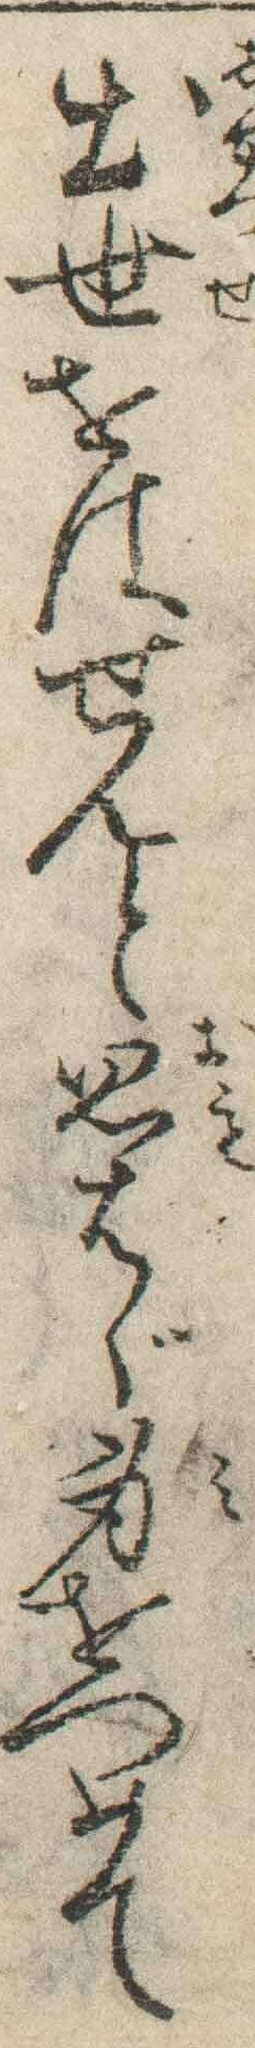出世をはせんと思はゞ身をつめて
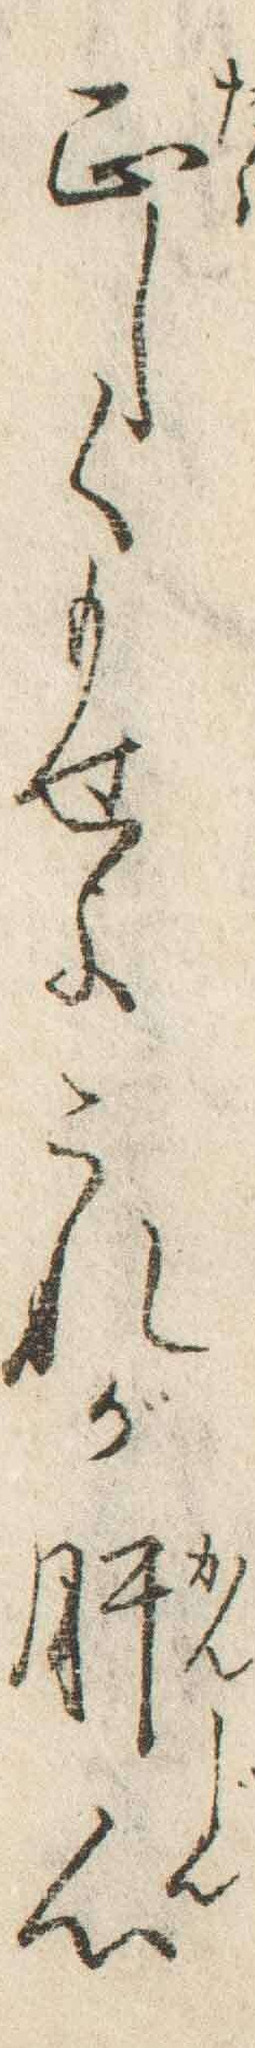正しくもせよこれが肝心
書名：撫育草
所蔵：東京学芸大学附属図書館 国文学研究資料館
